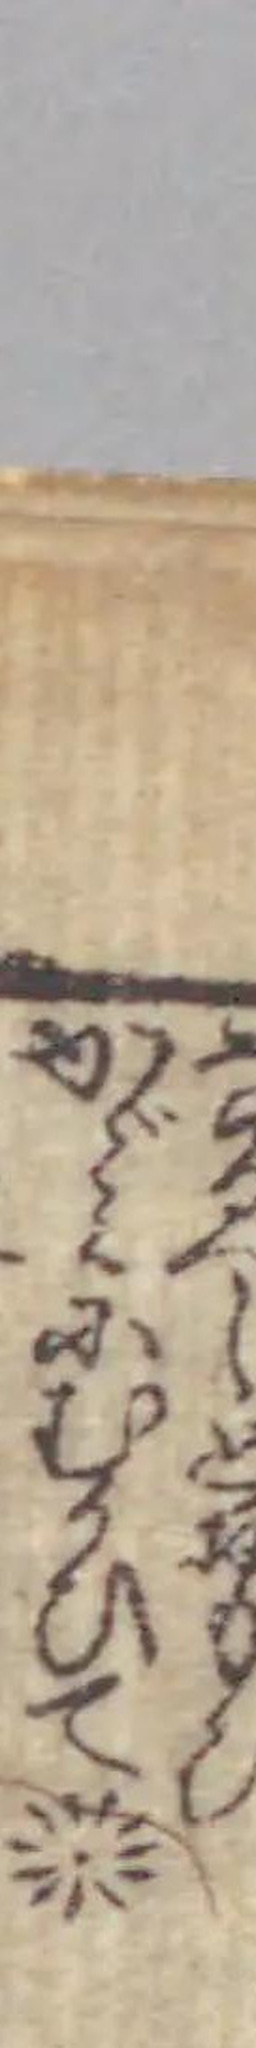かゞみにむかひて
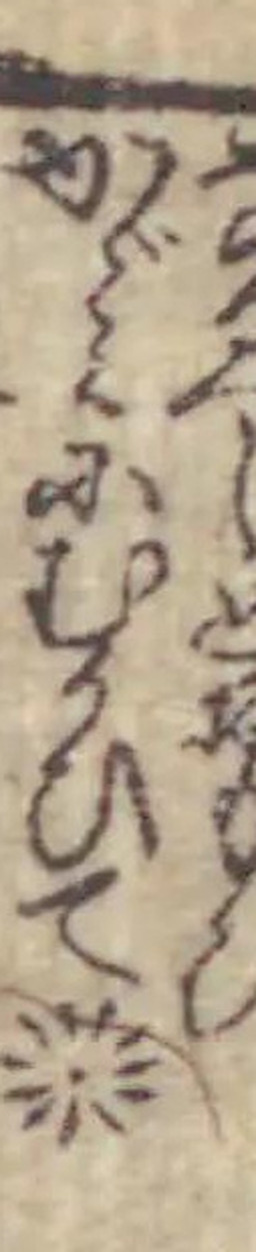かゞみにむかひて
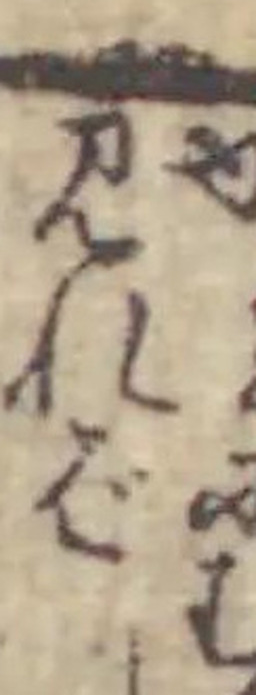見れば
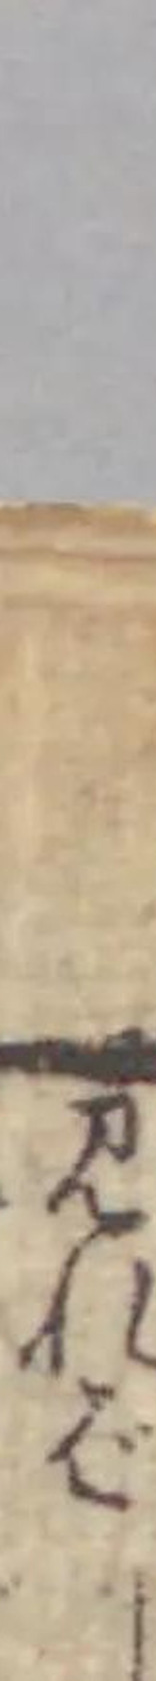見れば
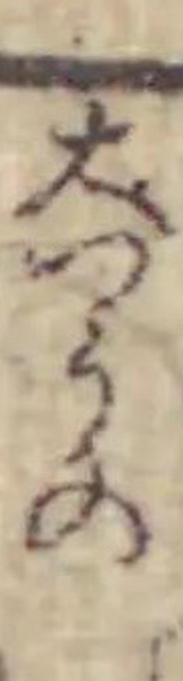大つうの
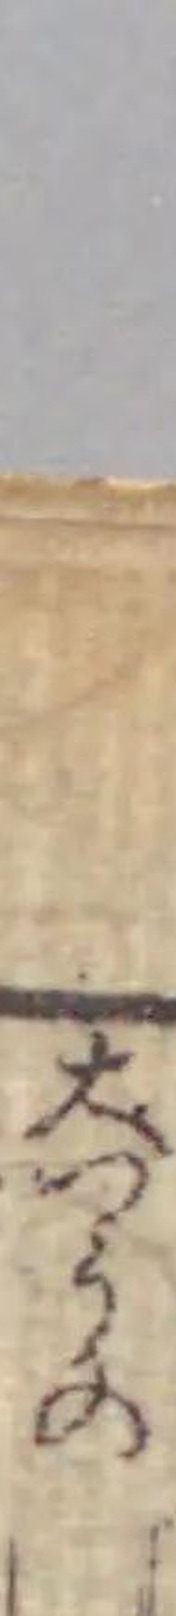大つうの
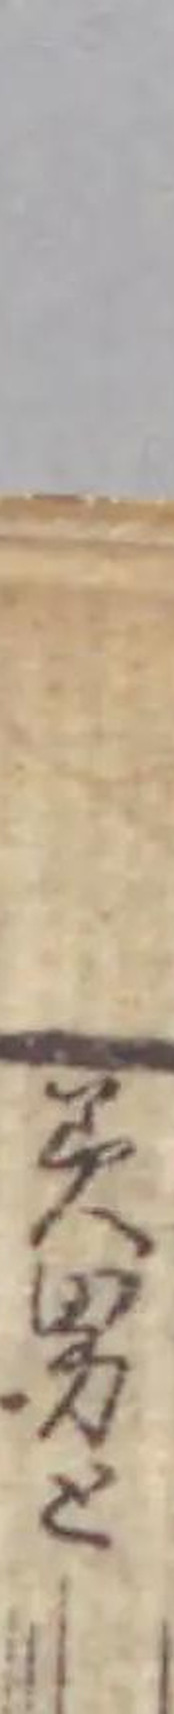美男と
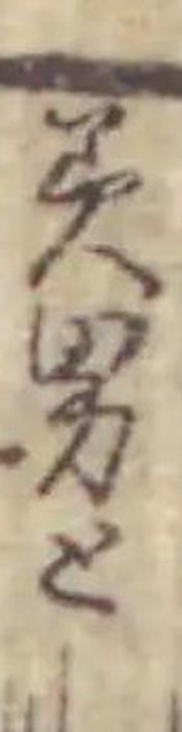美男と
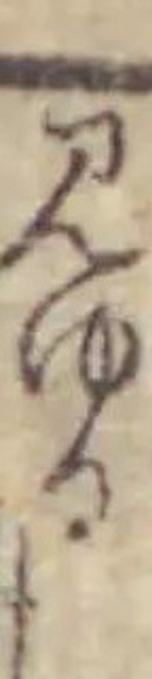見ゆる
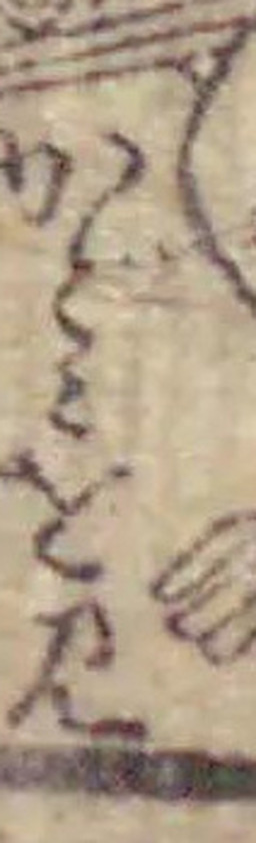かゞみを見
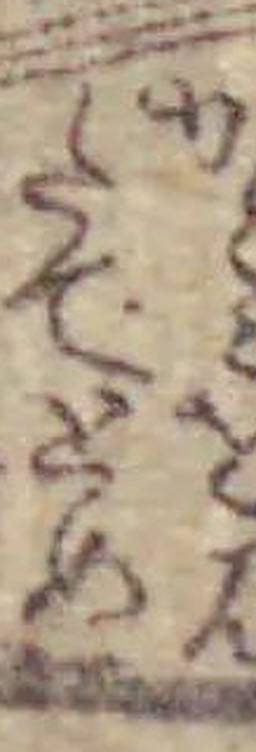たてとめ
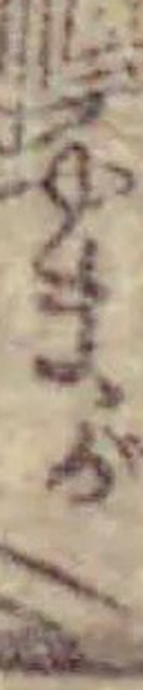やまが
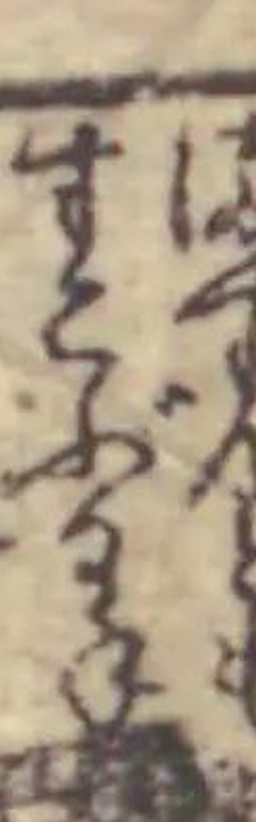すこぶる手
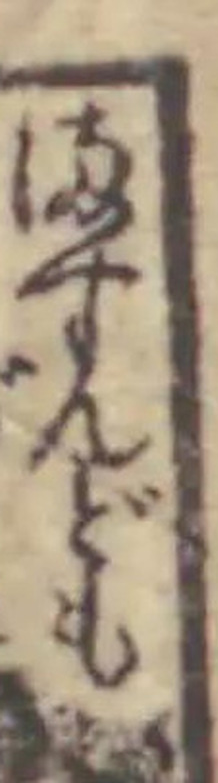ますんども
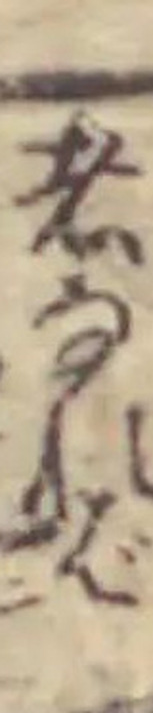者なれば
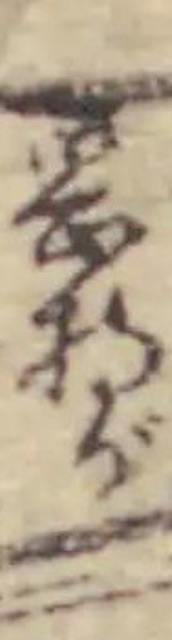岡持が
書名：亀山人家妖 3巻
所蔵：国立国会図書館 National Diet Library, JAPAN
